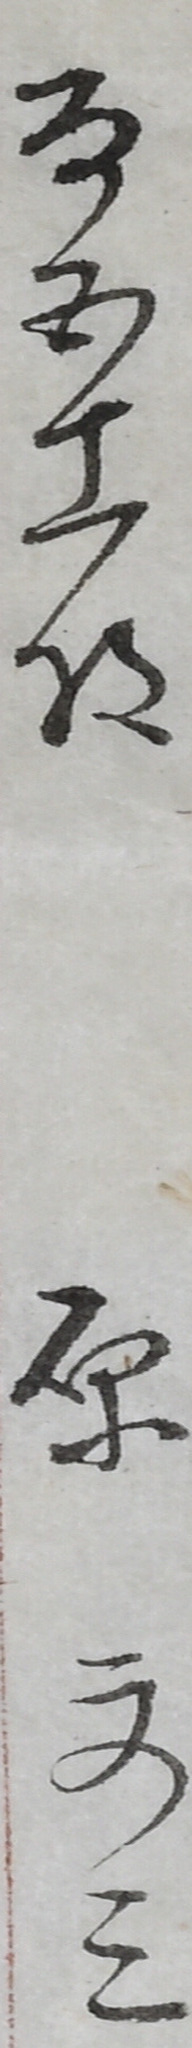百五十一枚原文三
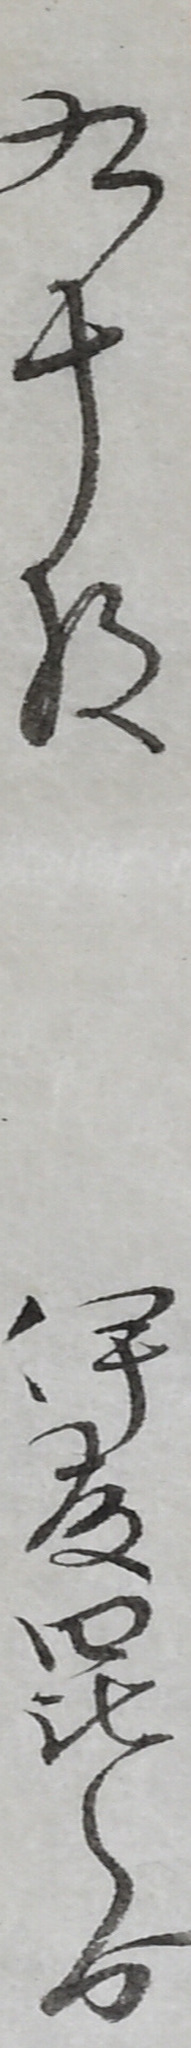九十枚伊藤四之郎
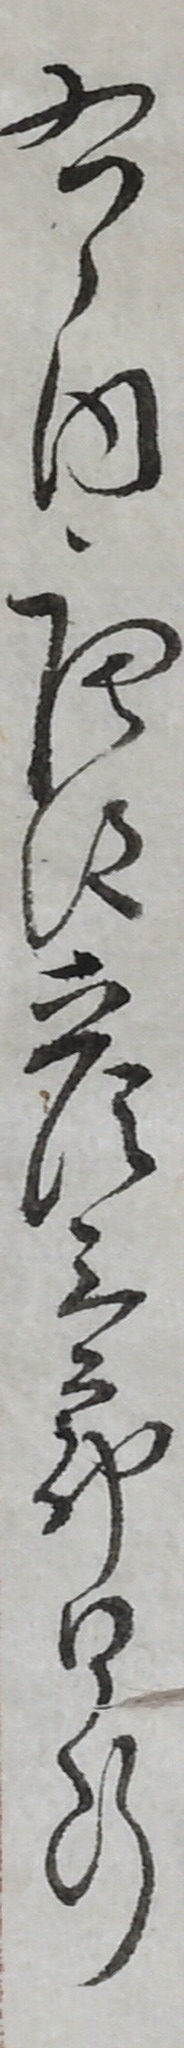右之内唐沢彦三郎同断
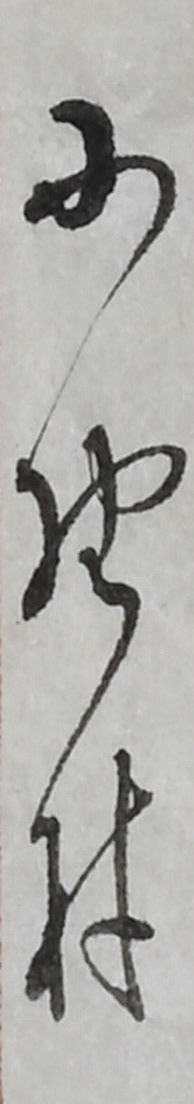小野村
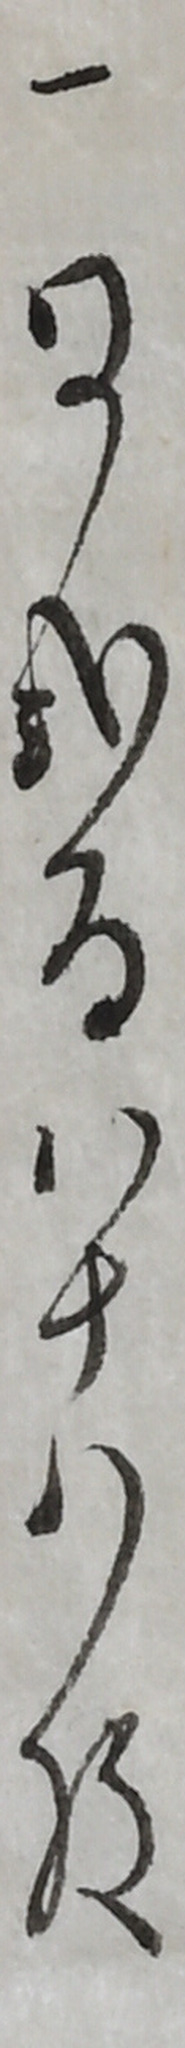一同弐百八十八枚
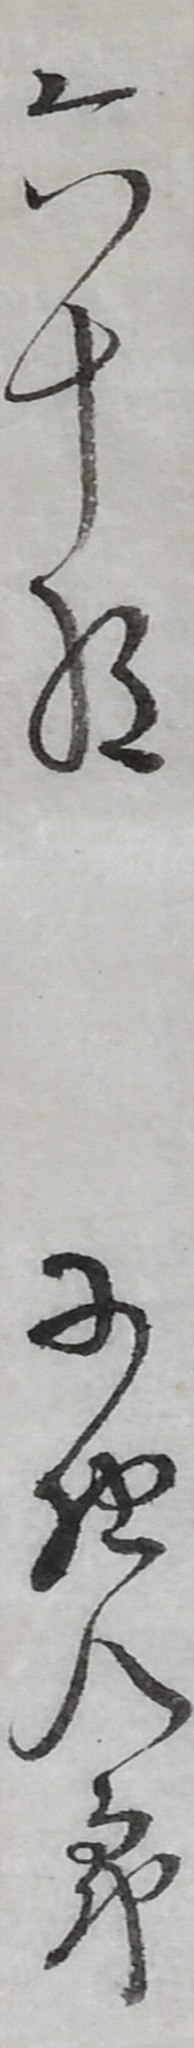六十枚小野八郎
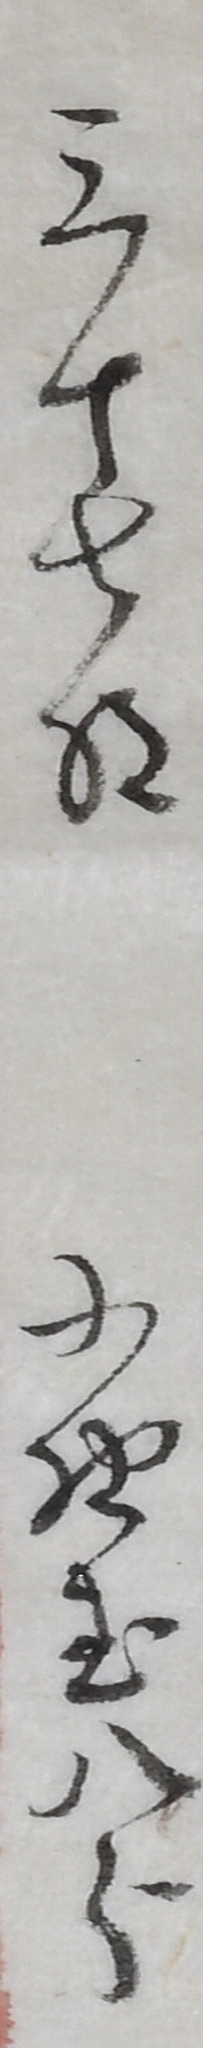三十七枚小野屋八郎
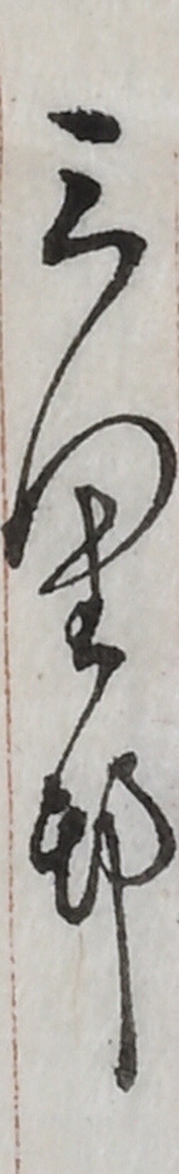三里郡
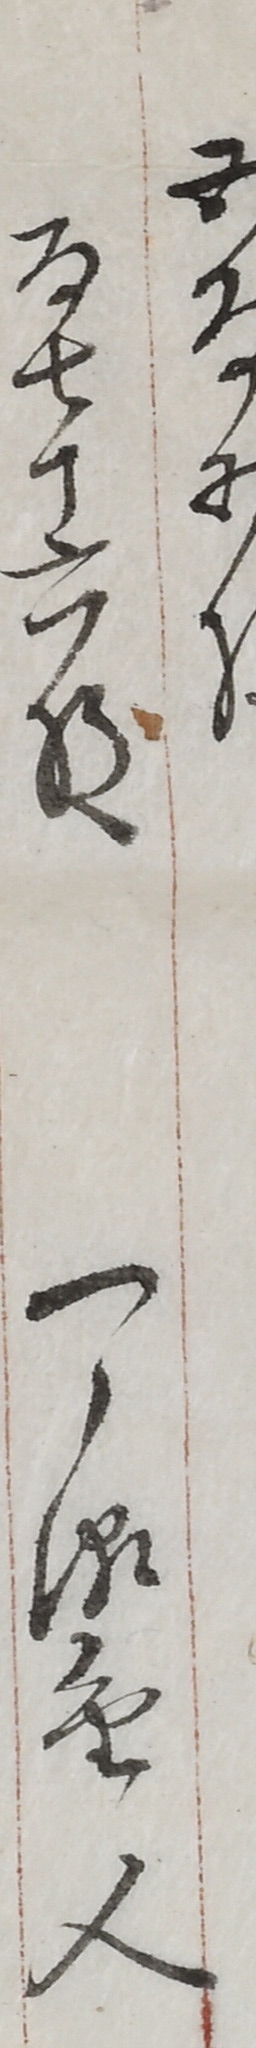百七十六枚一ノ瀬厘人
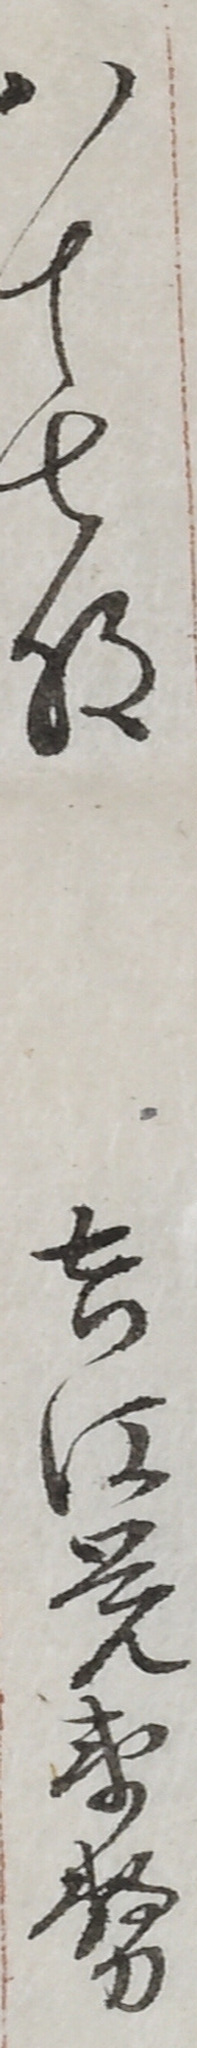八十七枚吉江覚束務
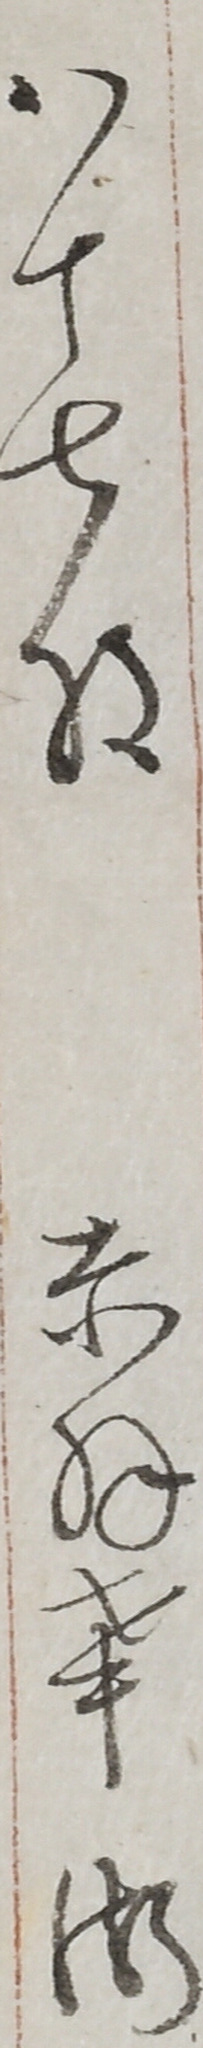八十七枚赤羽幸衛
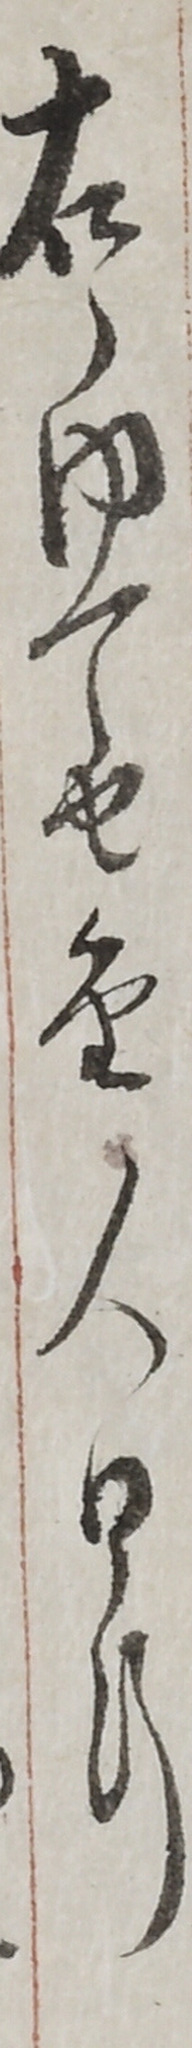右之内倉沢清人同断
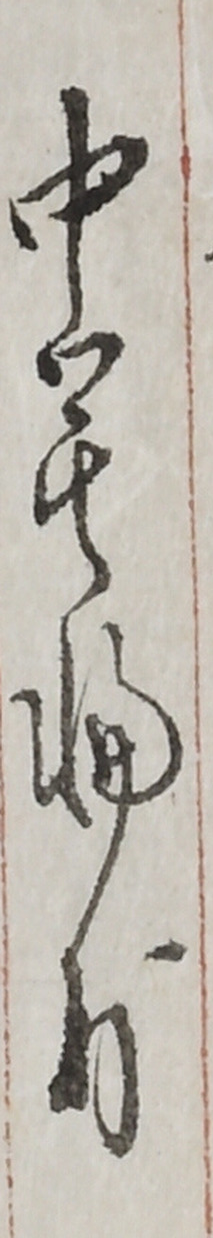中箕輪村
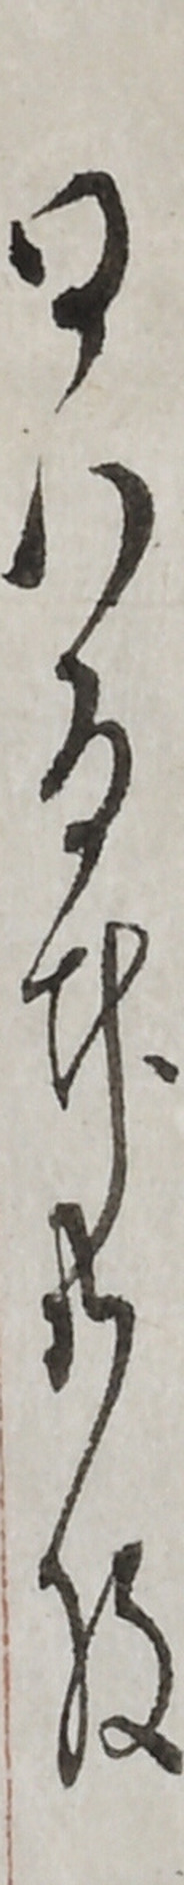一同八百廿弐枚
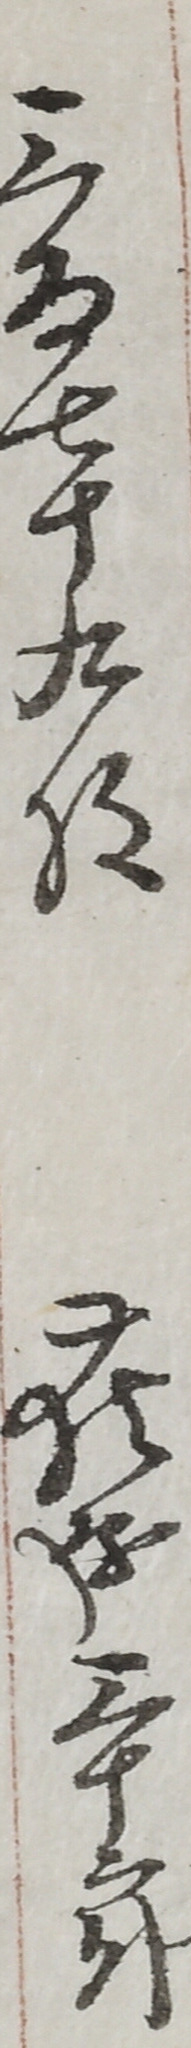三百七十九枚荻野三十郎
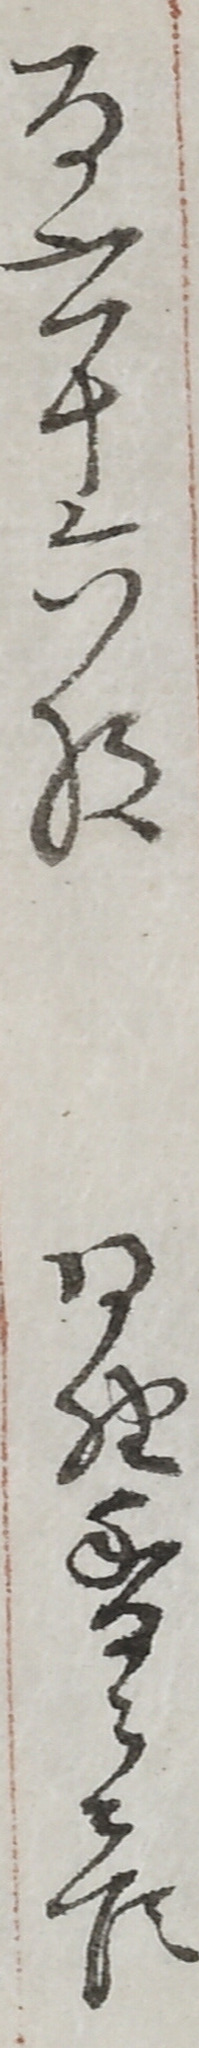百六十六枚日野香之彦
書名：郡役所勤務中御用抜書
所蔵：伊那市立高遠町図書館・合同会社AMANE
